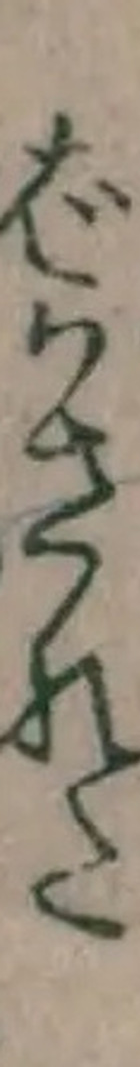ばかされた
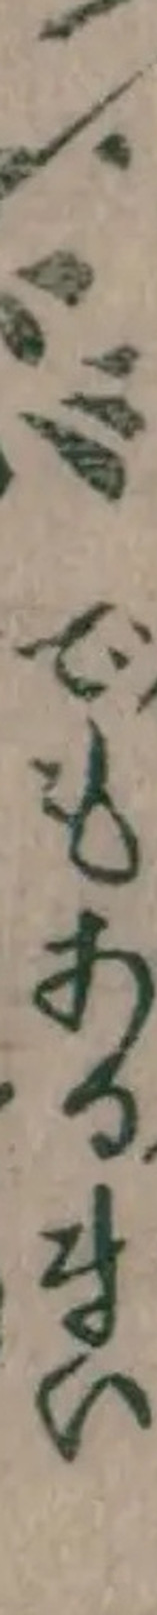でもあるまい
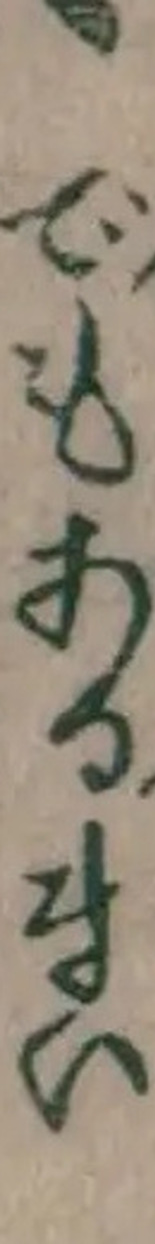でもあるまい
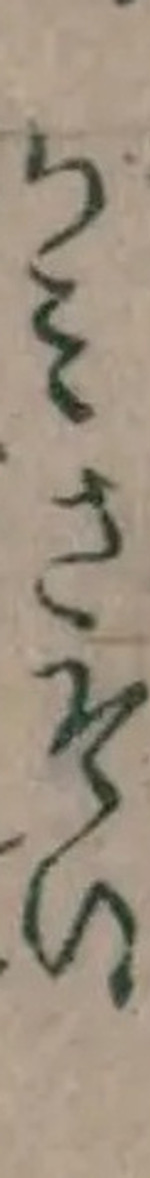かみさそい
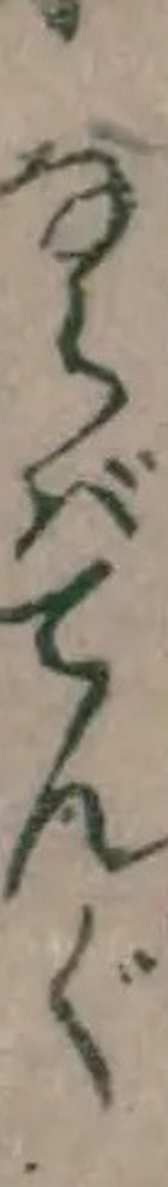ならばてんぐ
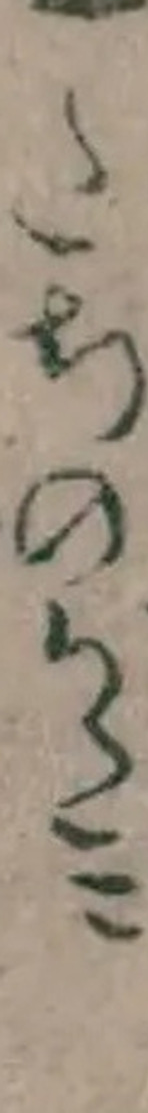たちのかたに
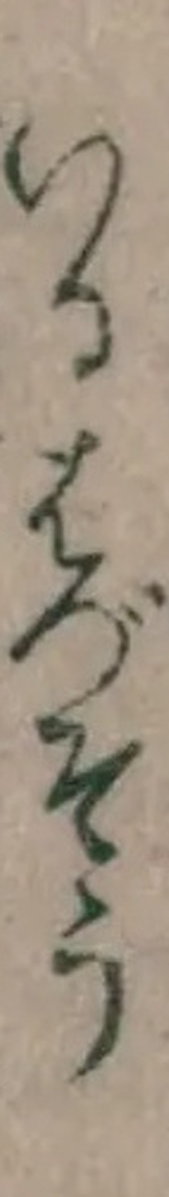いるはづそう
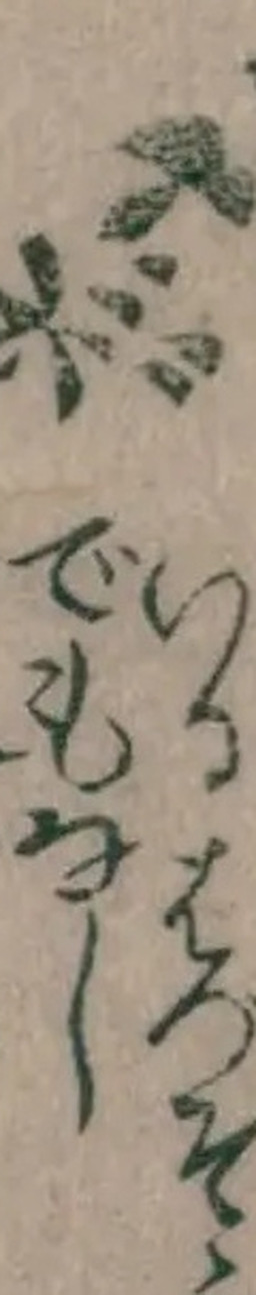でもなし
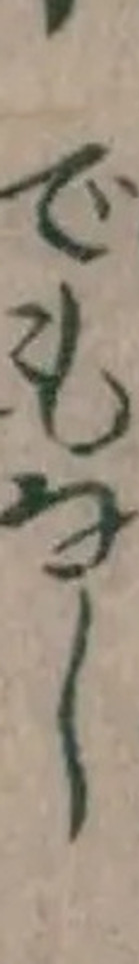でもなし
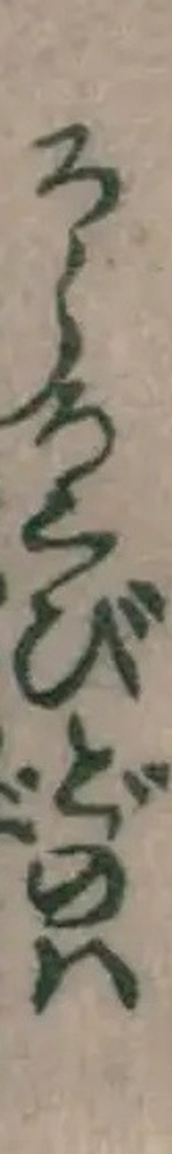ろくろくびどのは
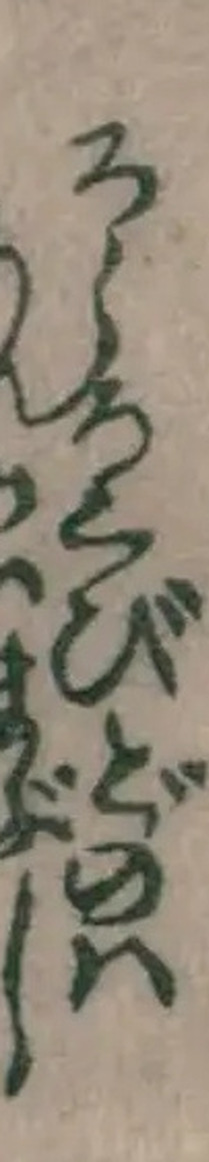ろくろくびどのは
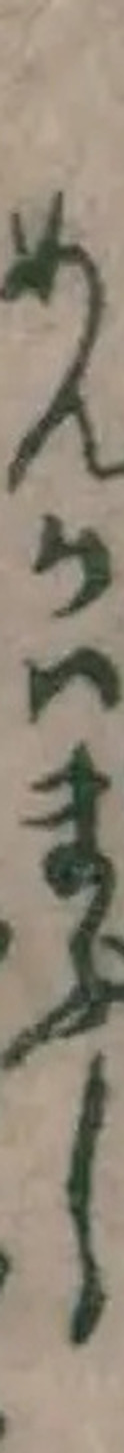めんかはまぶし
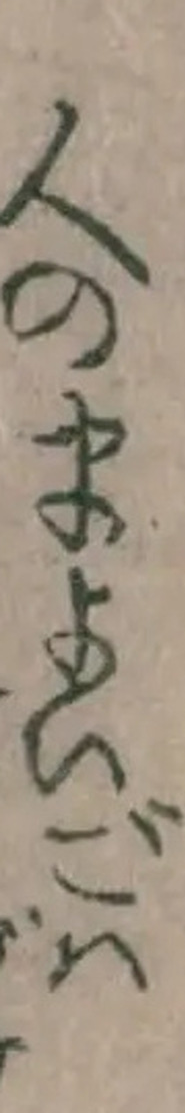人のまよいごは
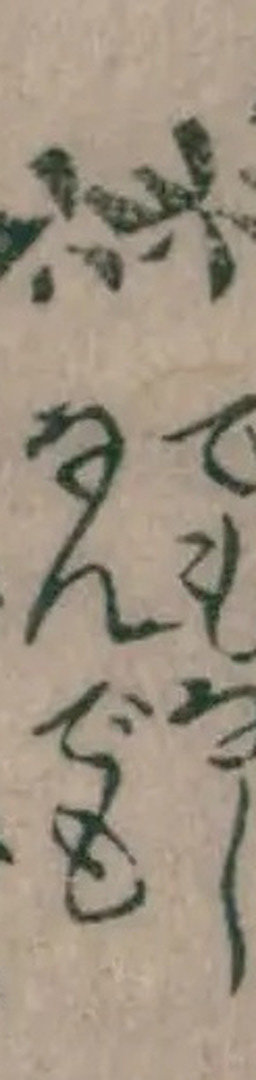なんでも
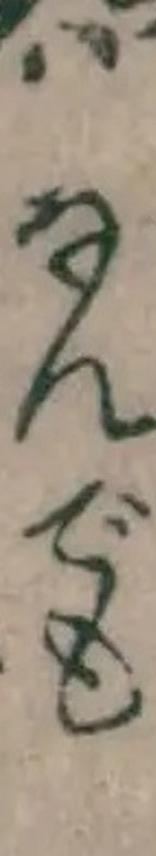なんでも
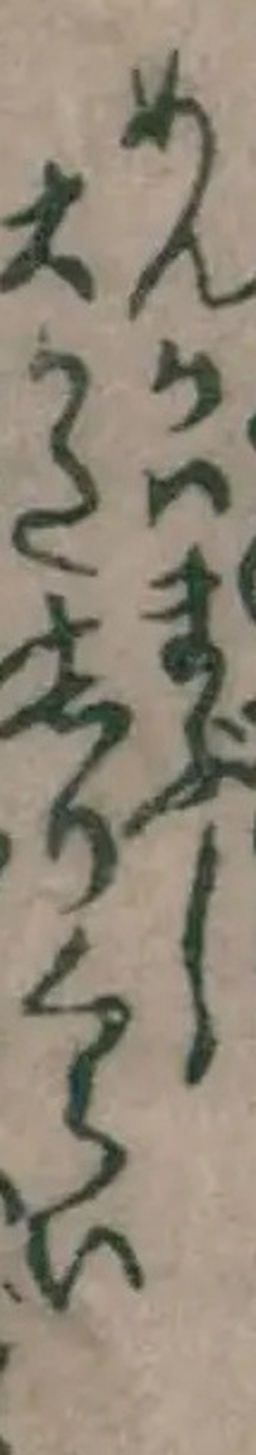大かたしりくらい
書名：信有奇怪会
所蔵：国立国会図書館 National Diet Library, JAPAN
